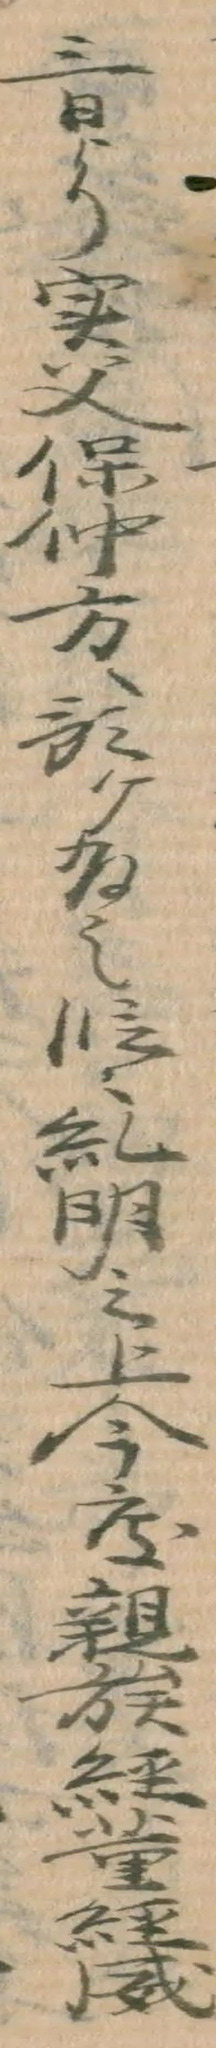三日より実父保仲方へ預け有之段々糺明之上今度親族経董経威
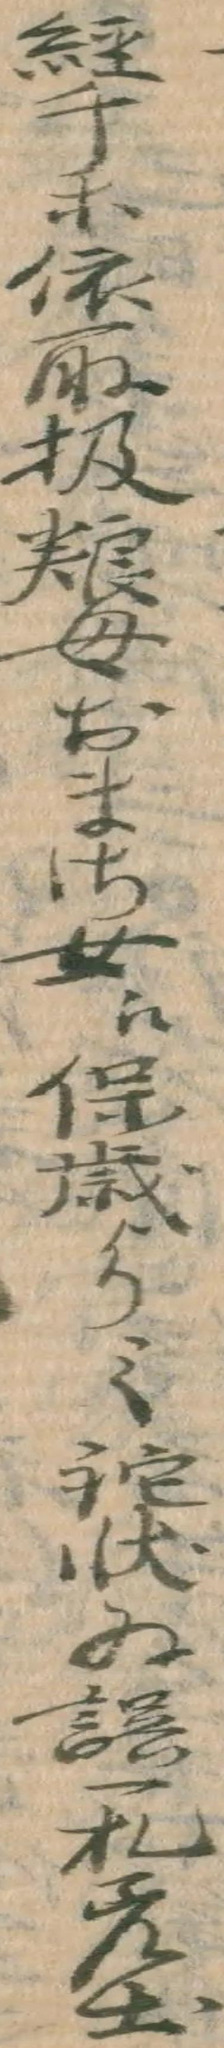経千等依取扱養母おまさ女江保歳より之詫状給誤一札差出
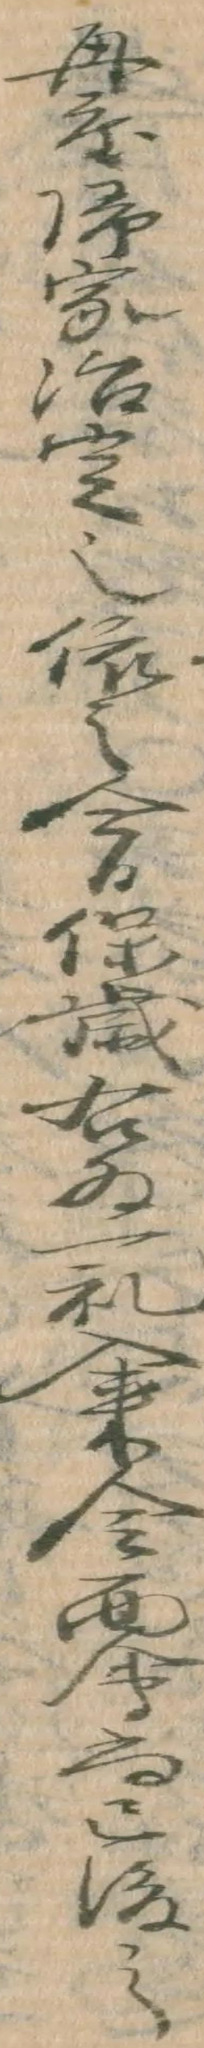再度帰家治定也依之今日保歳右為一礼入来令面會尚已後之
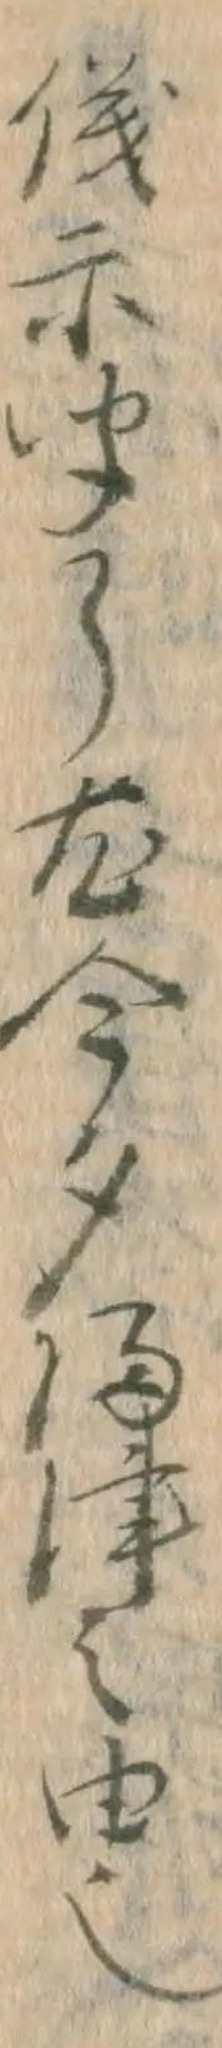儀示聞了尤今夕帰津之由也
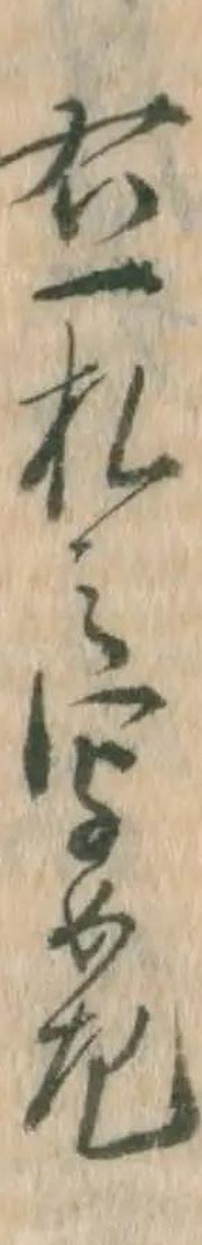右一札之写如左
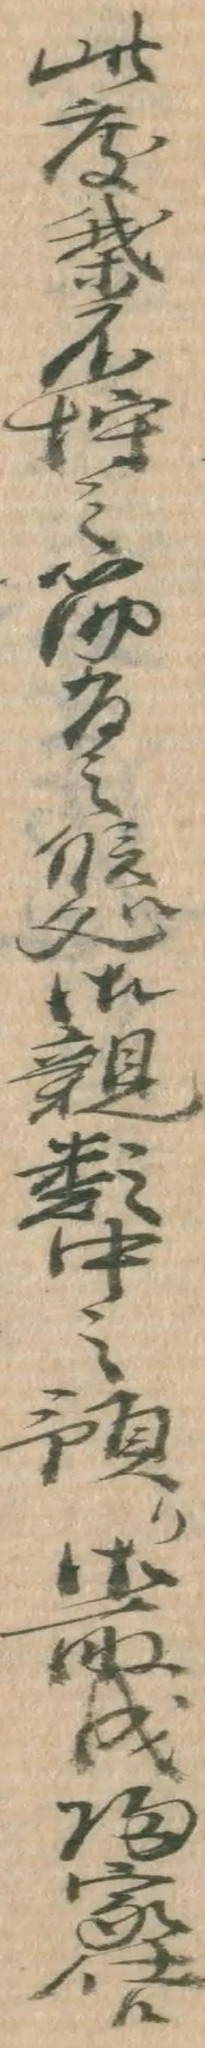此度我不埒之筋有之候処御親類中之預リ御取成帰家仕候
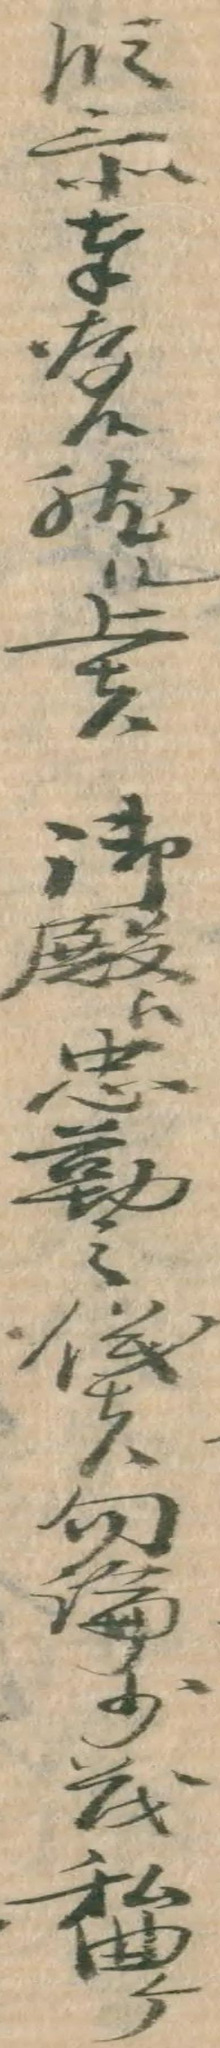段忝奉存候然ル上者御殿江忠勤之儀者勿論少茂私曲ヶ
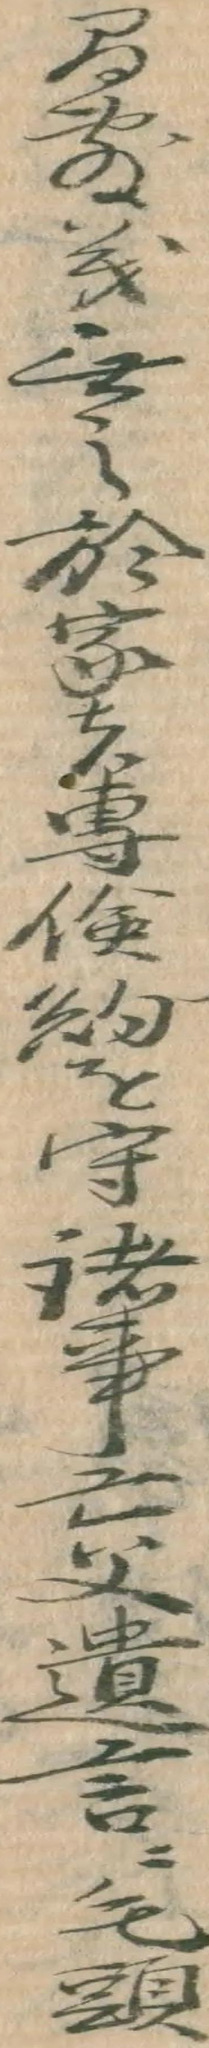間敷義無之於家者専倹約を守諸事亡父遺言ニ毛頭
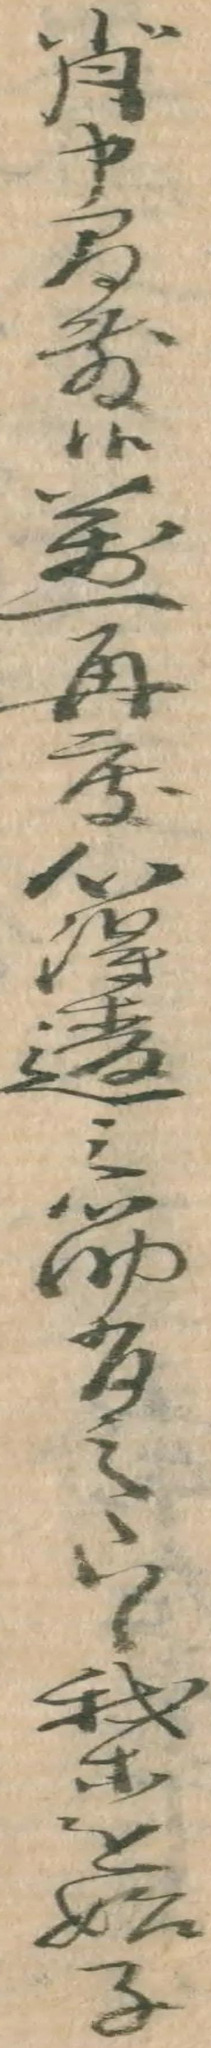背申間敷候萬一再度心得違之筋有之候ハゝ我等を始子
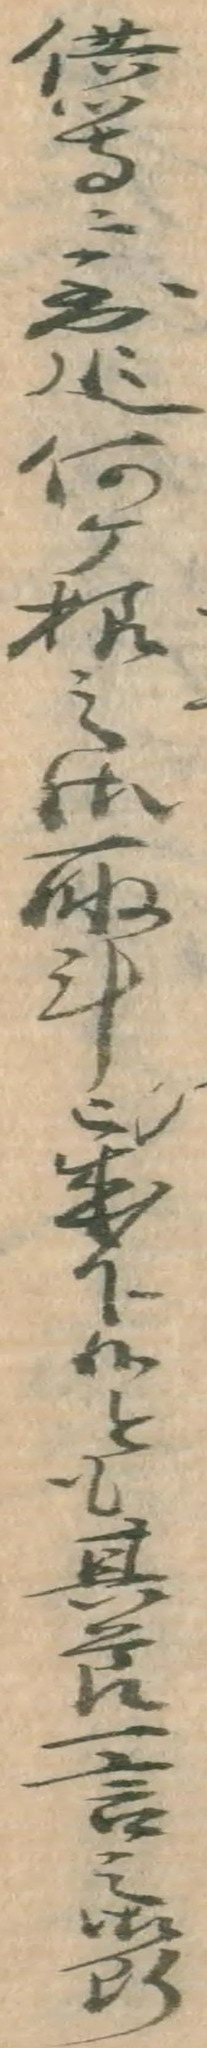供等に至迄何ヶ様之御取斗被成下候とも其節一言之御断

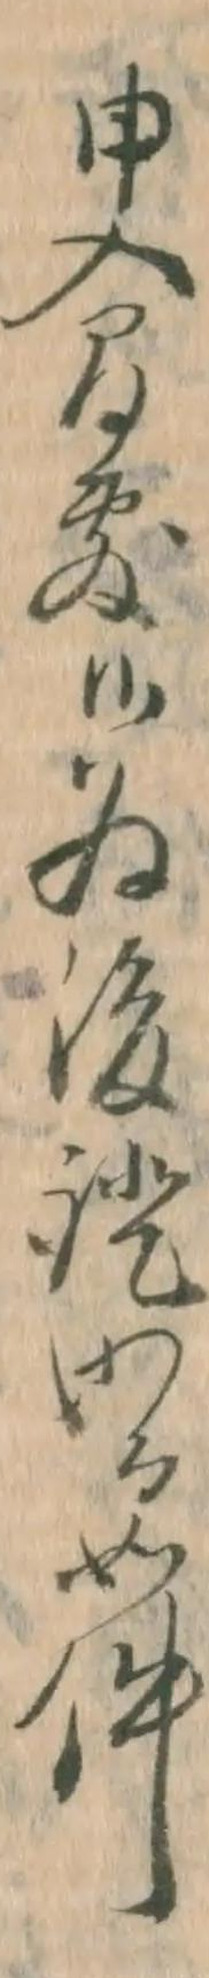申入間敷候為後證仍而如件
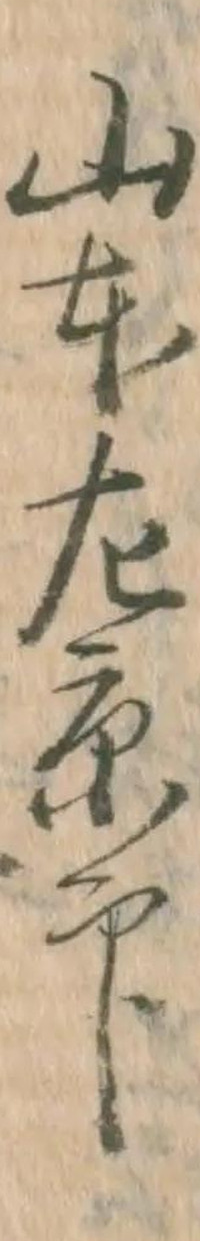山本左京印
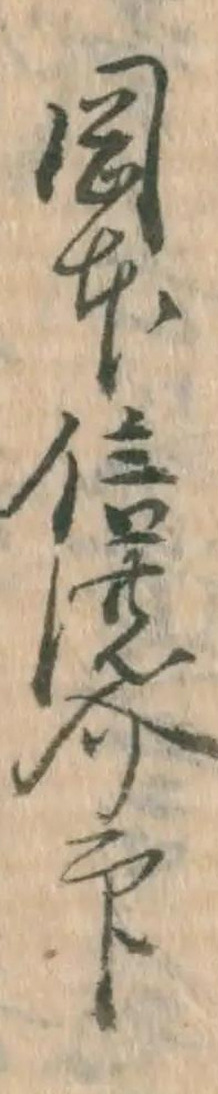岡本信濃介印
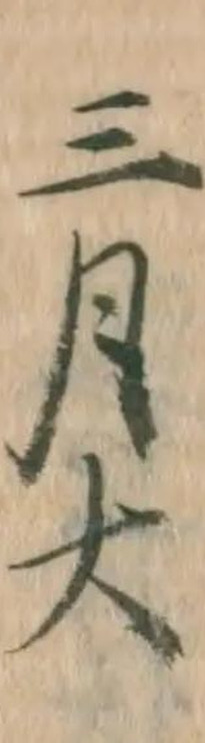三月大
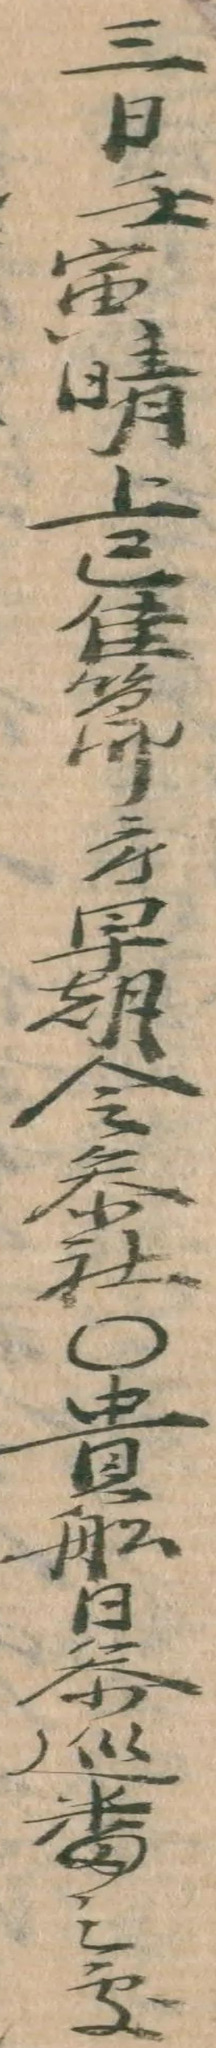三日壬寅晴上巳佳節ニ付早朝令参社〇貴舩日参巡番之處
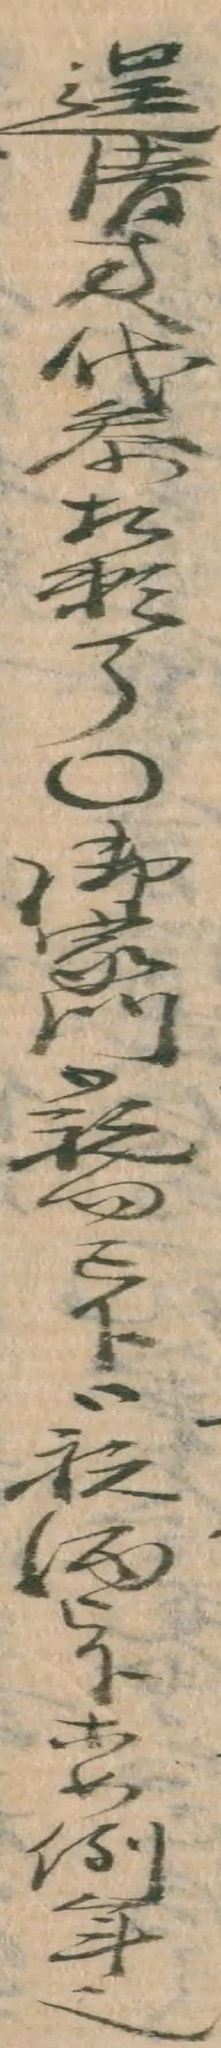逞清方へ代参相頼了○御家門御祝向被下御祝酒被下ホ如例年也
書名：賀茂社記録. 第65冊
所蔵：国立国会図書館 National Diet Library, JAPAN
